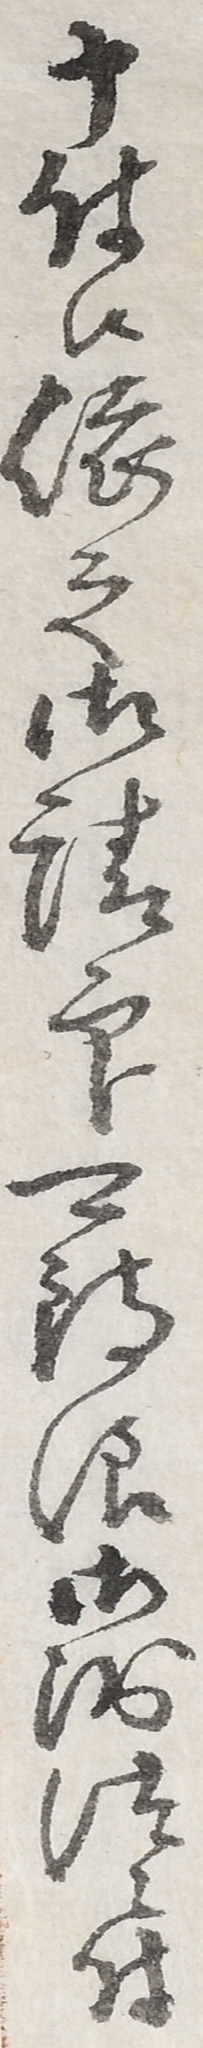申付候依之御請印可致様御沙汰ニ付
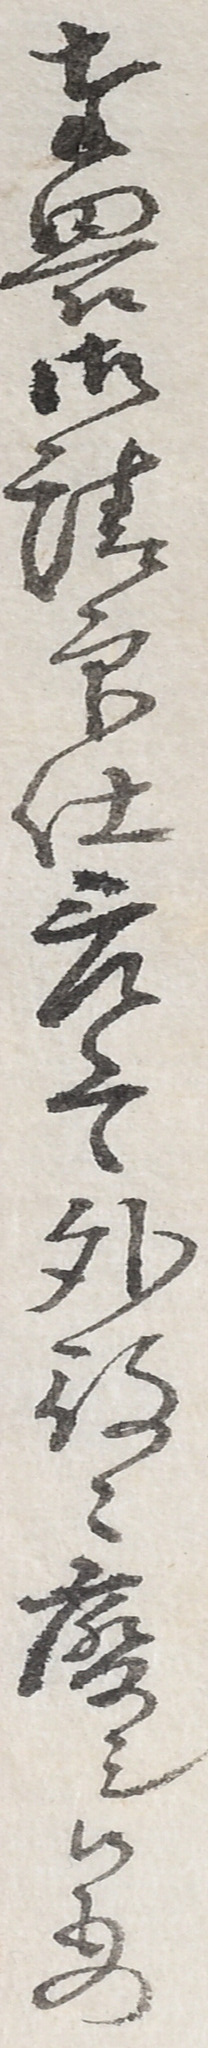奉畏御請印仕差上候外役々廃シ候もの
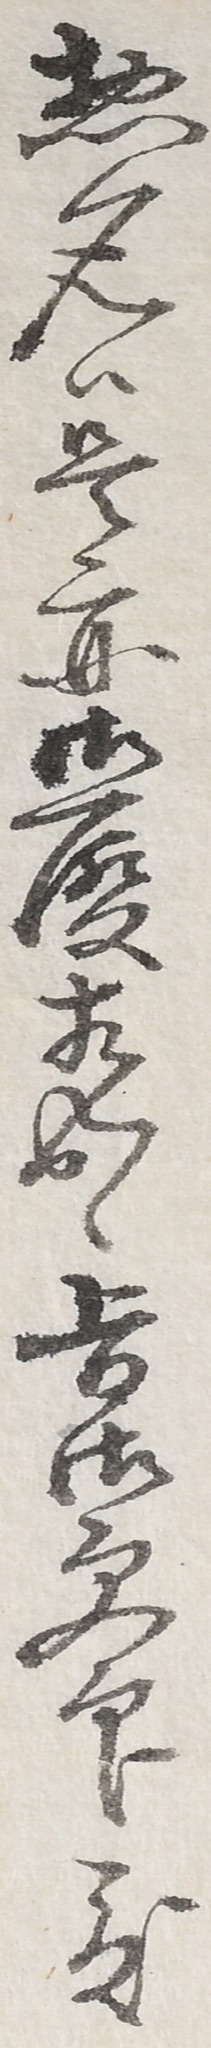総名は是亦御廃相成候旨御受印致
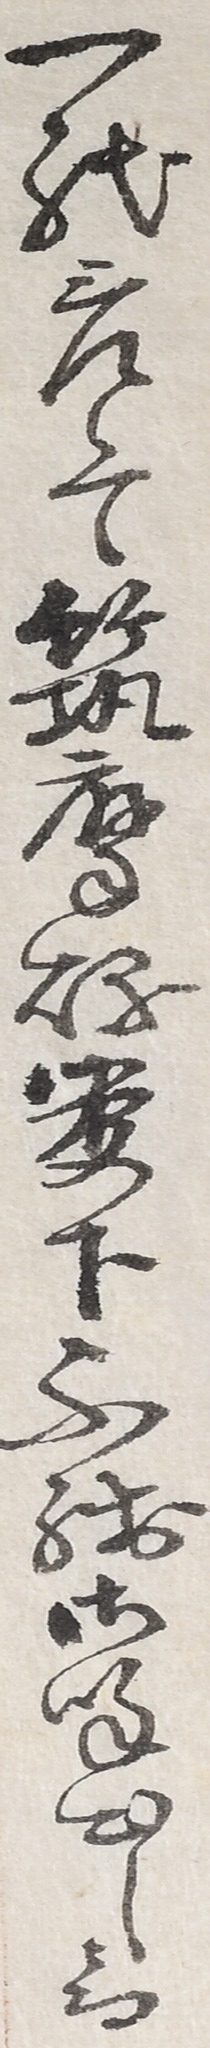一紙差上候筑摩県管下不残御呼出しニ而
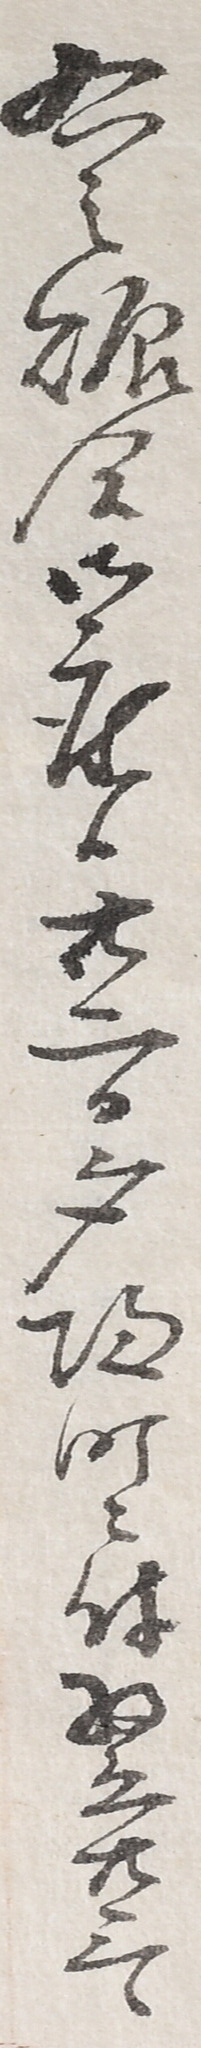右之賑合御座候廿二日夕帰町ニ付翌廿三日
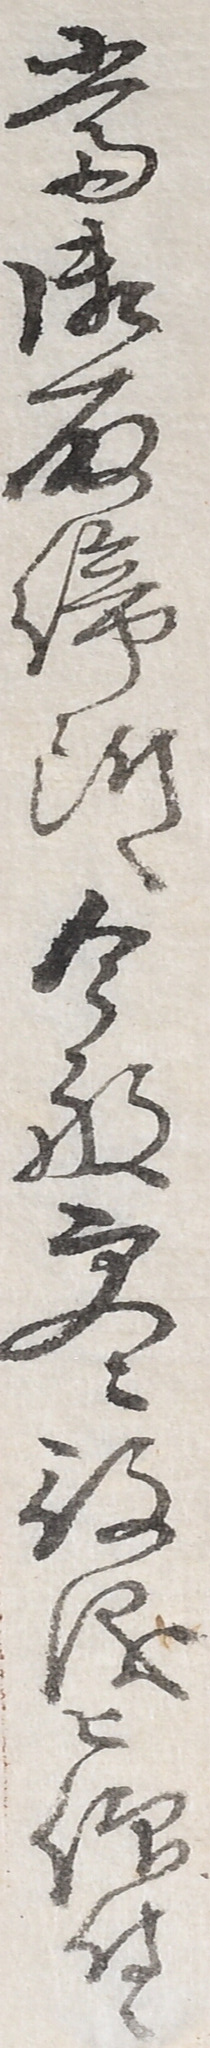当御取締所へ今般更ニ役儀被仰付候
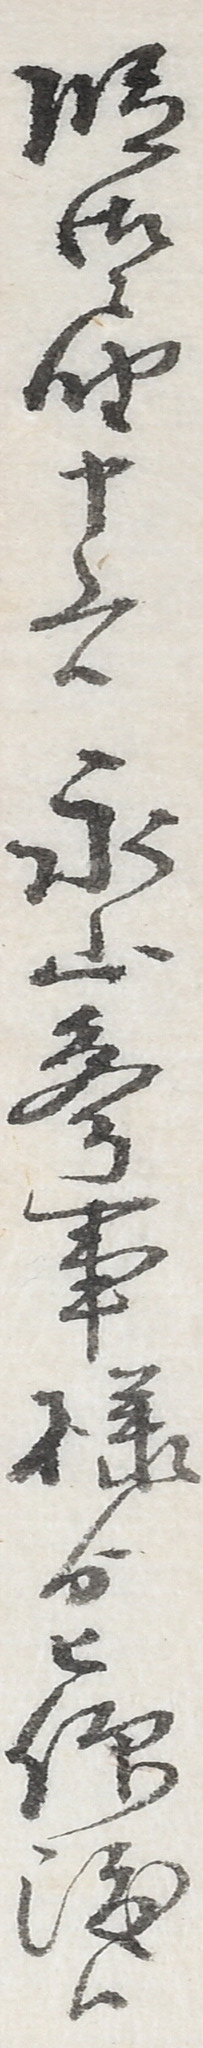段御届申上候永山参事様より被仰渡候
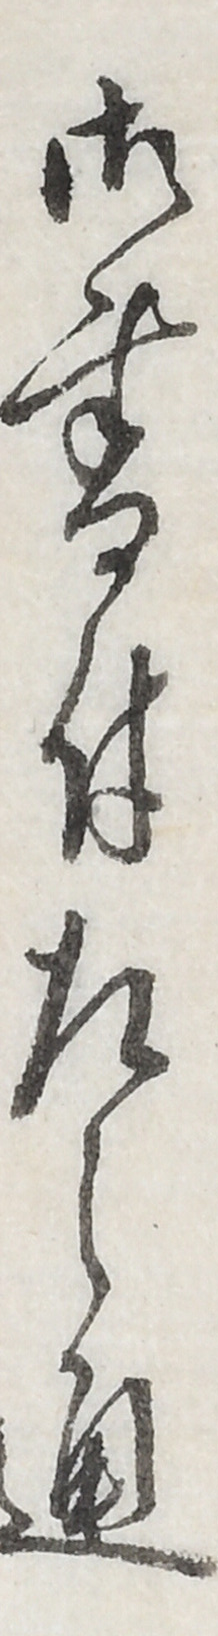御書付左之通
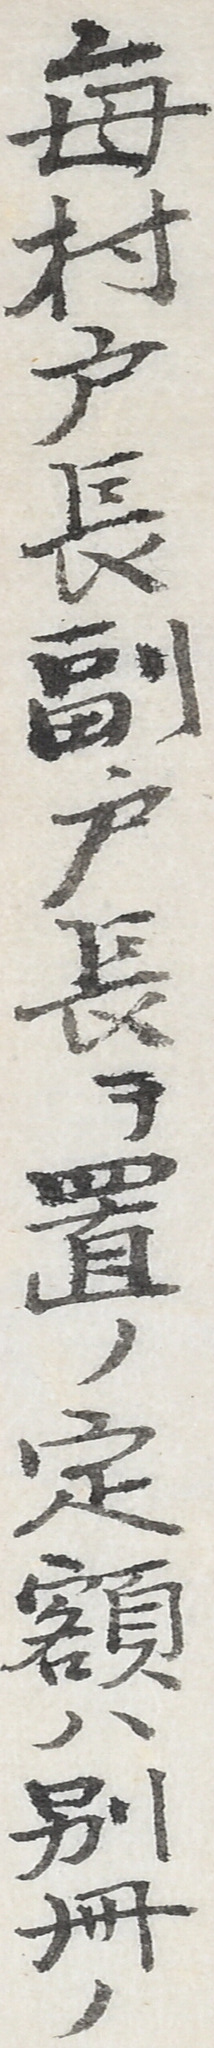毎村戸長副戸長ヲ置ノ定額ハ別冊ノ
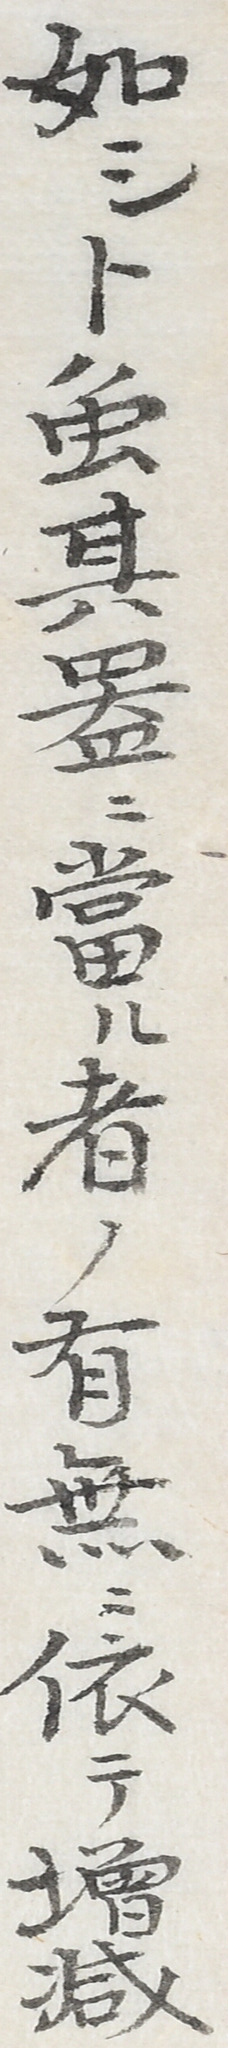如シト雖其器ニ当ル者ノ有無ニ依テ増減
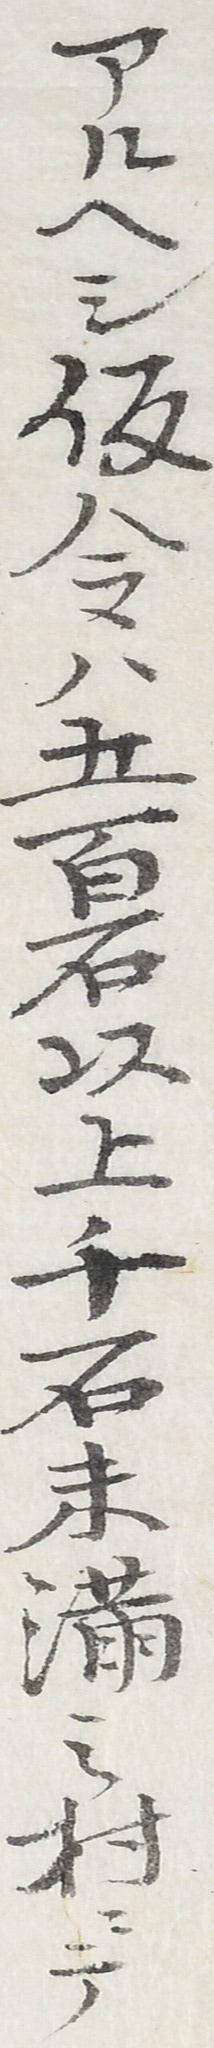アルヘシ仮令ハ五百石以上千石未満之村ニテ
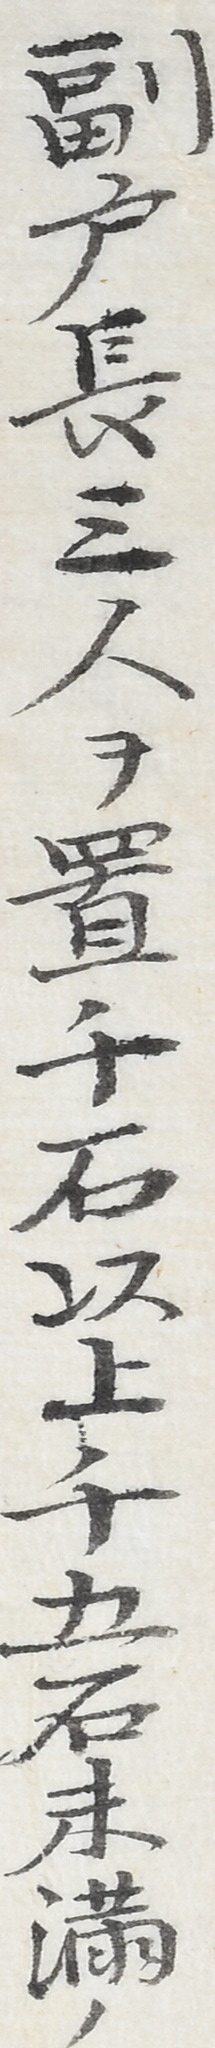副戸長三人ヲ置千石以上千五石未満ノ
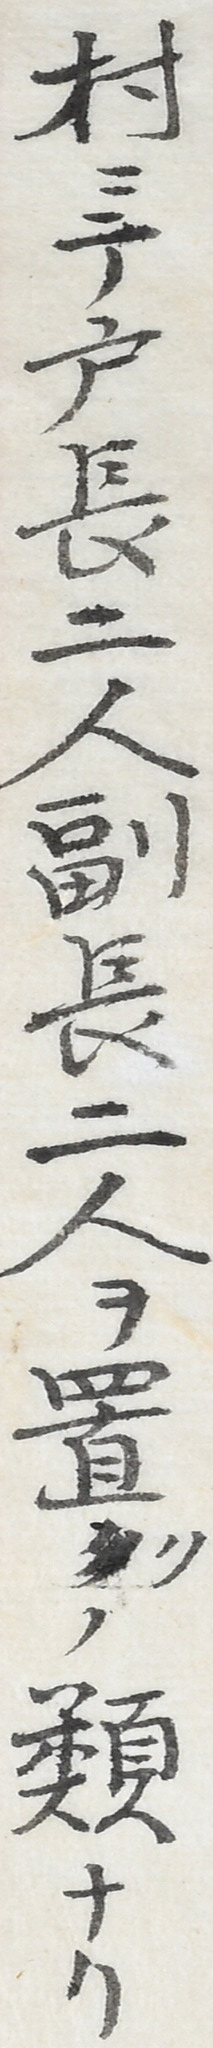村ニテ戸長二人副長二人ヲ置クノ類ナリ
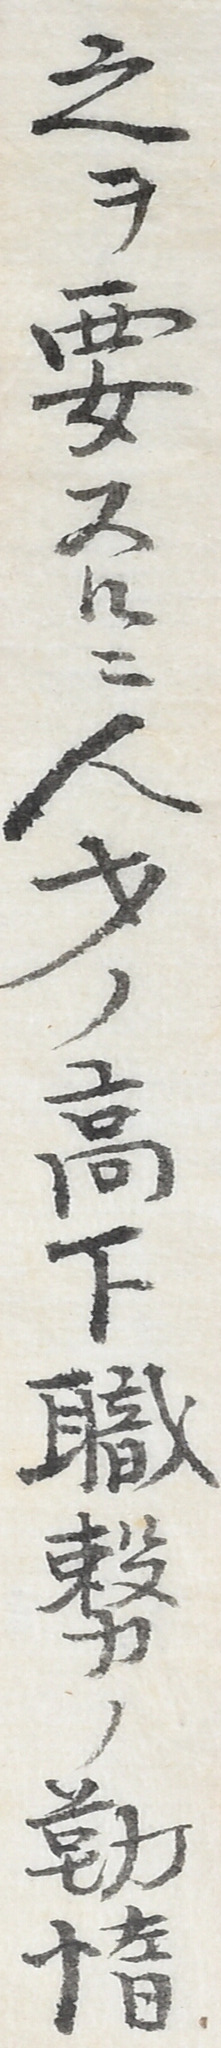之ヲ要スルニ人才ノ高下職務ノ勤惰

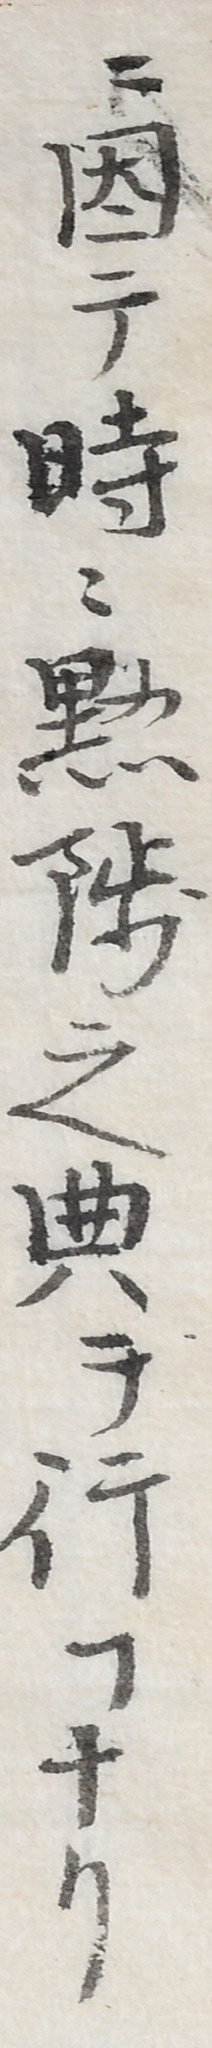ニ因テ時々黜陟之典ヲ行フナリ
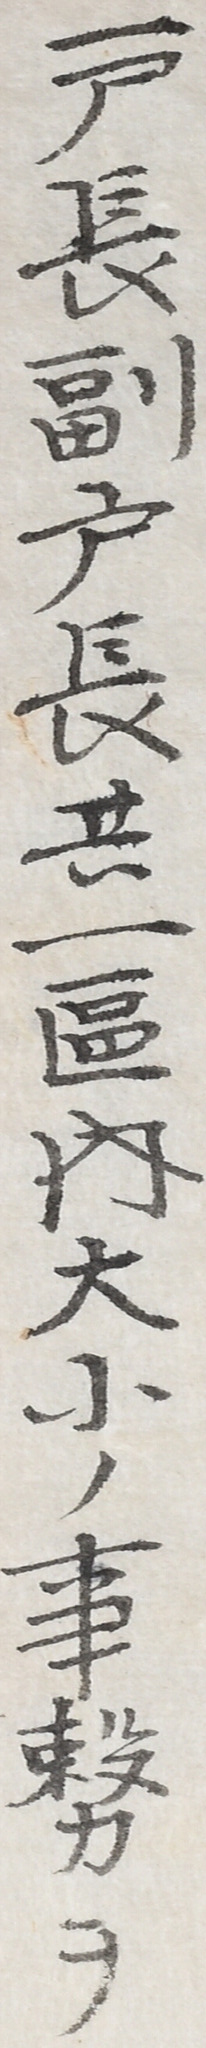戸長副戸長共一区内大小ノ事務ヲ
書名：壹番・御布告一式
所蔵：伊那市立高遠町図書館・合同会社AMANE
